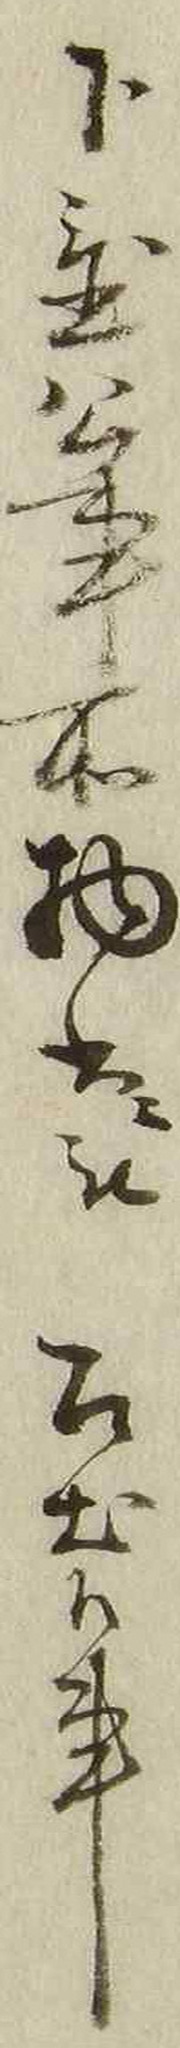下置公事所物書ニ被召出候事
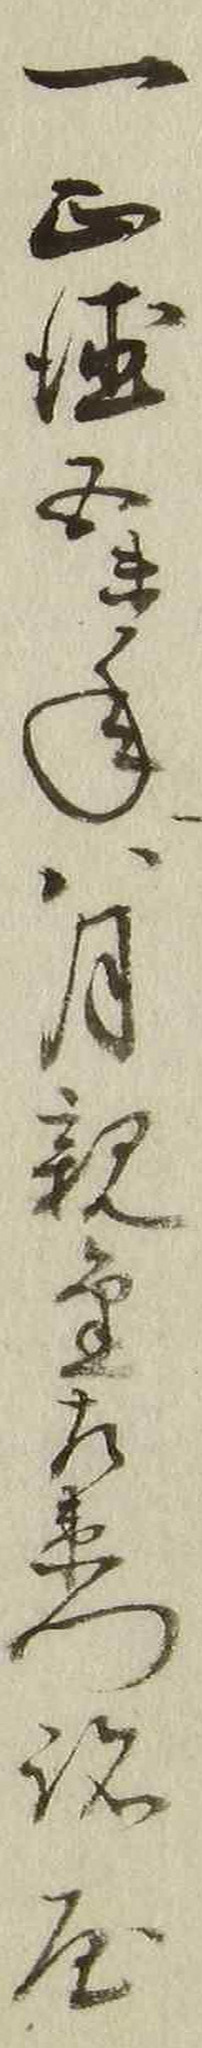一正徳五未年八月親金左衛門跡屋
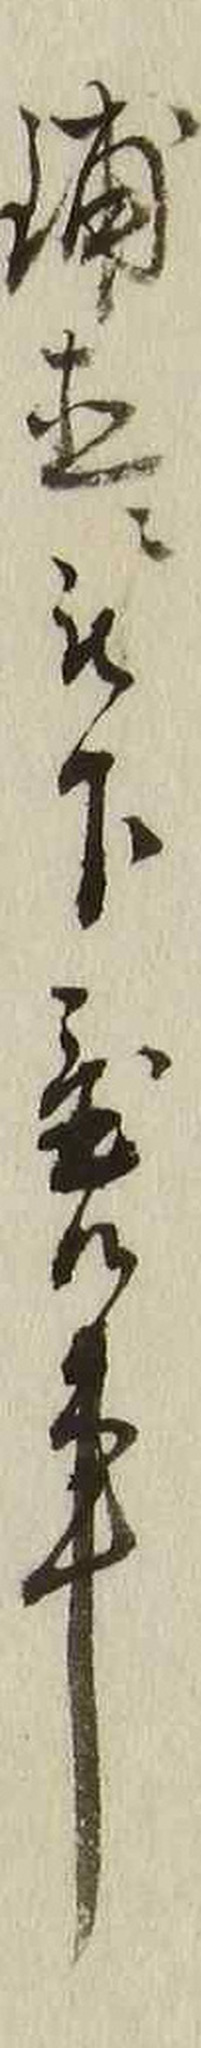鋪直ニ被下置候事
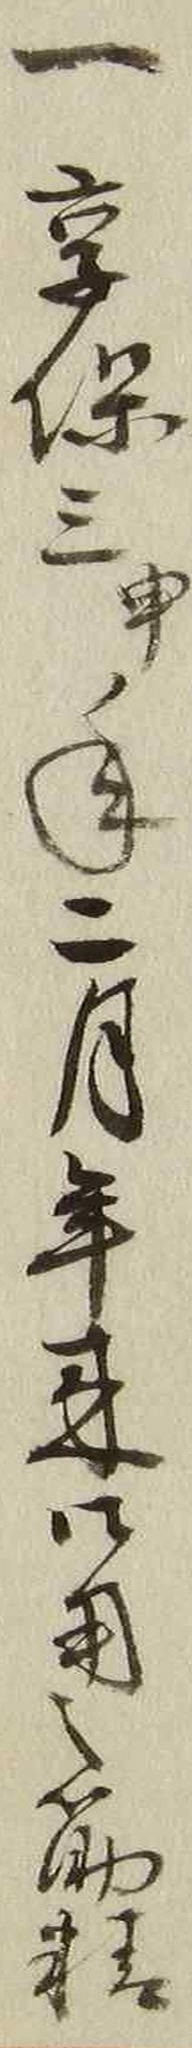一享保三申年二月年来御用之筋精
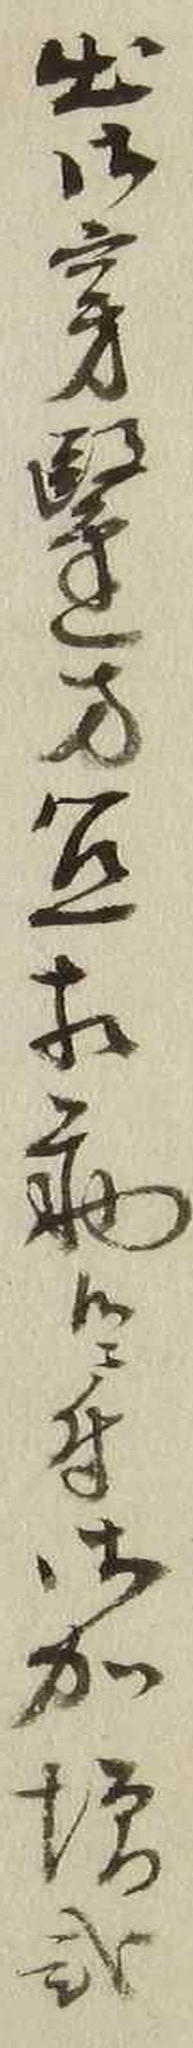出御穿鑿方宜相勤候ニ付御加増弐
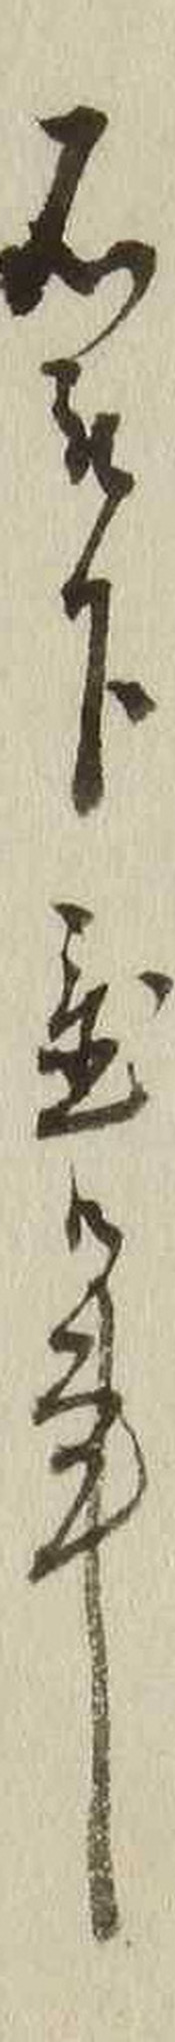石被下置候事
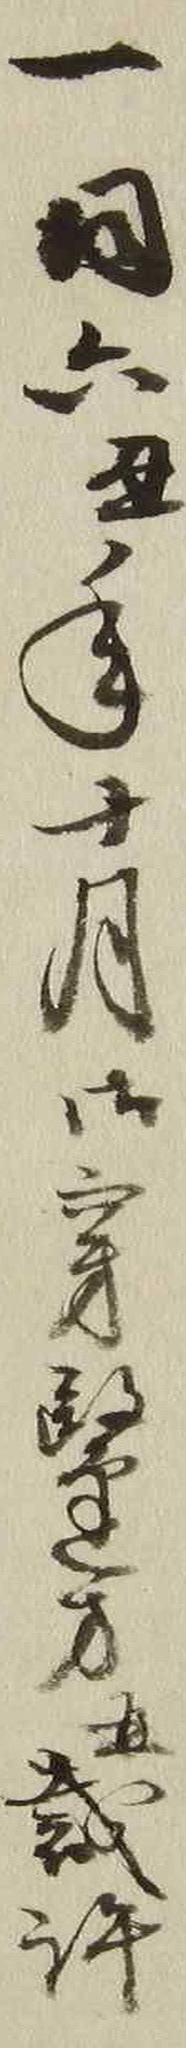一同六丑年十月御穿鑿方再裁許
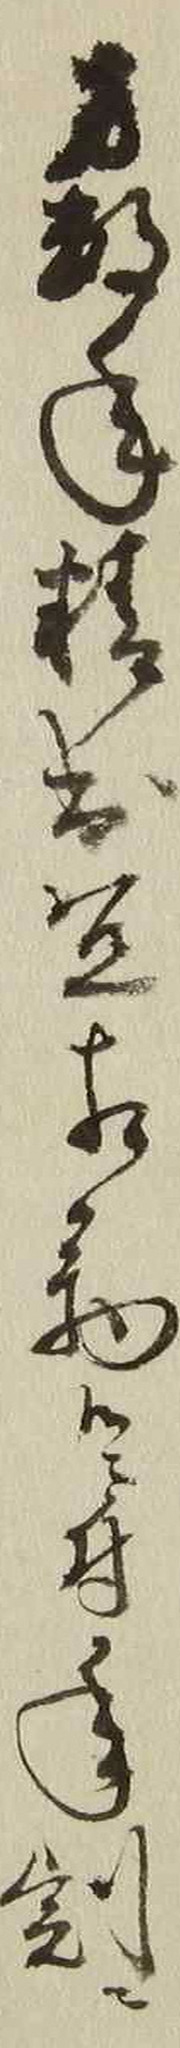方数年精出宜相勤候ニ付年割ニ
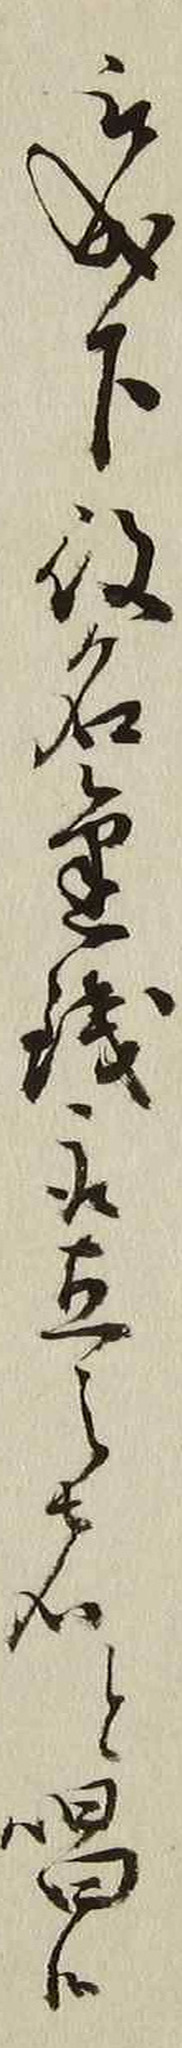被成下役名金銭取立之者と唱候
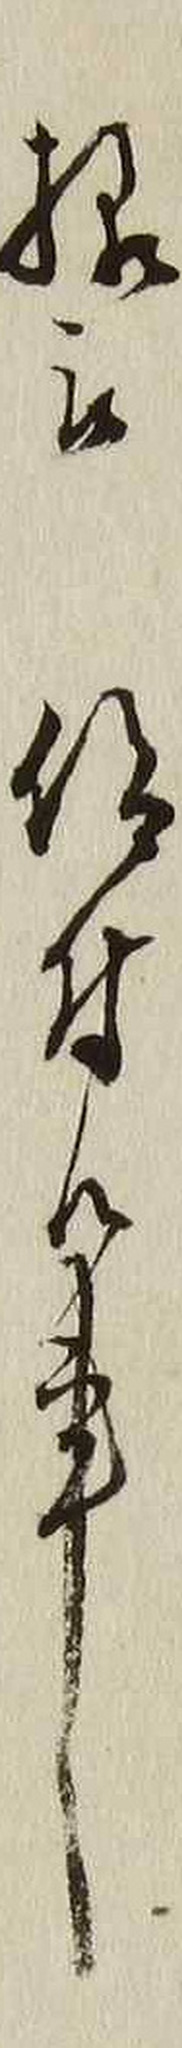様被仰付候事
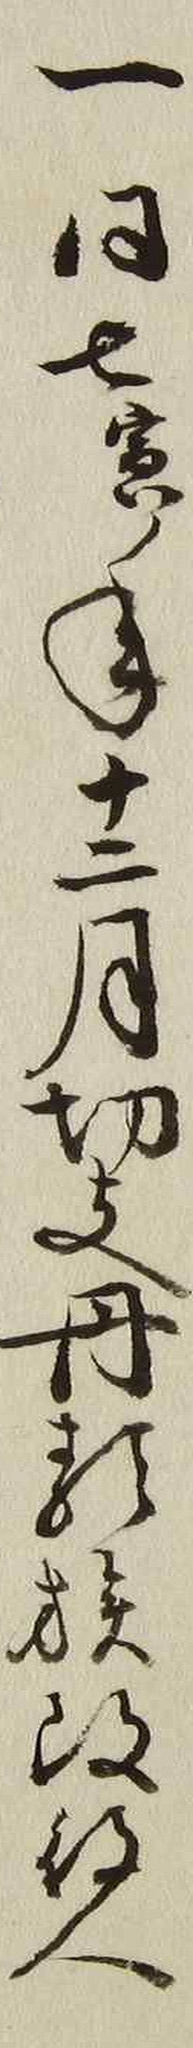一同七寅年十二月切文丹類族改役人
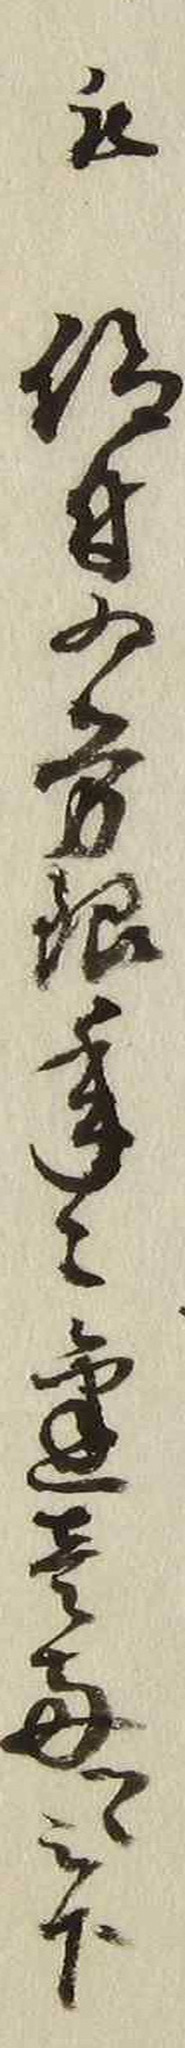被仰付為労銀年々金壱両ツヽ被下
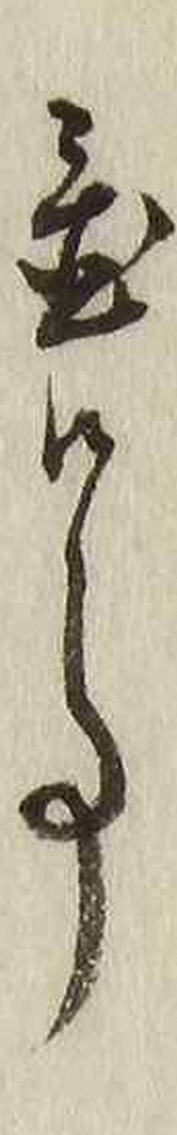置候事
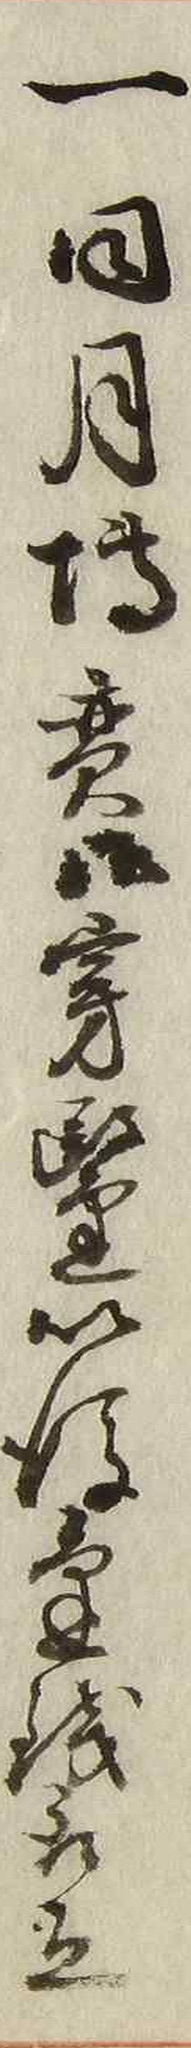一同月博奕御穿鑿以後金銭取立
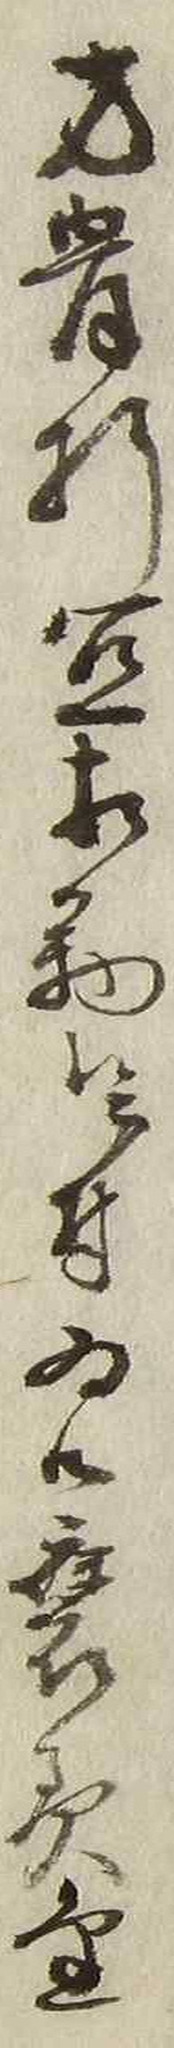方骨折宜相勤候ニ付為御褒美金
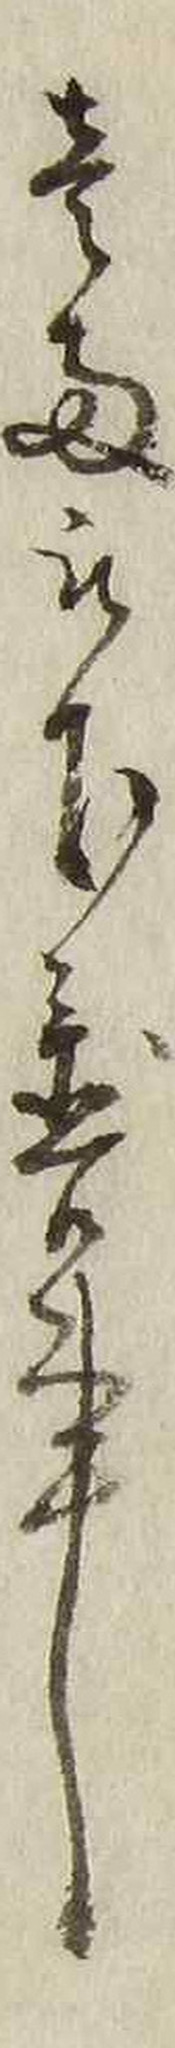壱両被下置候事
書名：諸士系譜　巻之39　は之部7
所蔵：会津若松市立会津図書館
